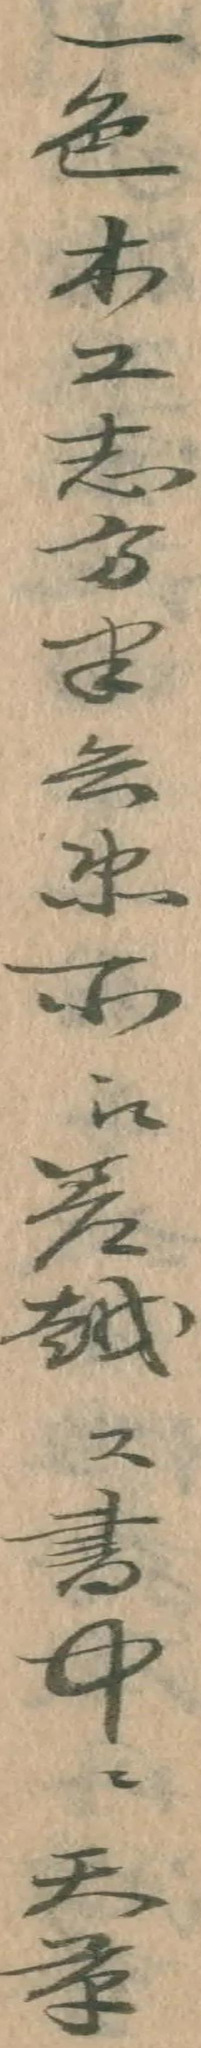一色木工志方半兵衛所江差越ス書中に天草
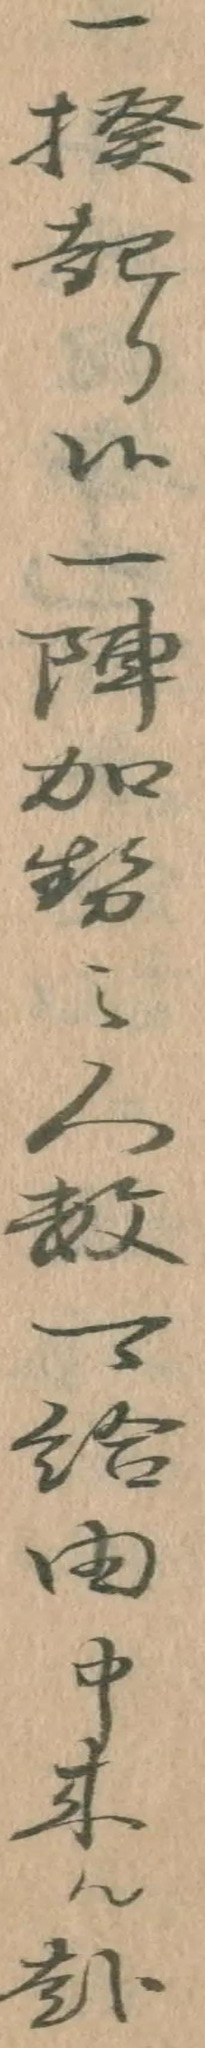一揆起り候一陣加勢之人数可給由申来ル赴
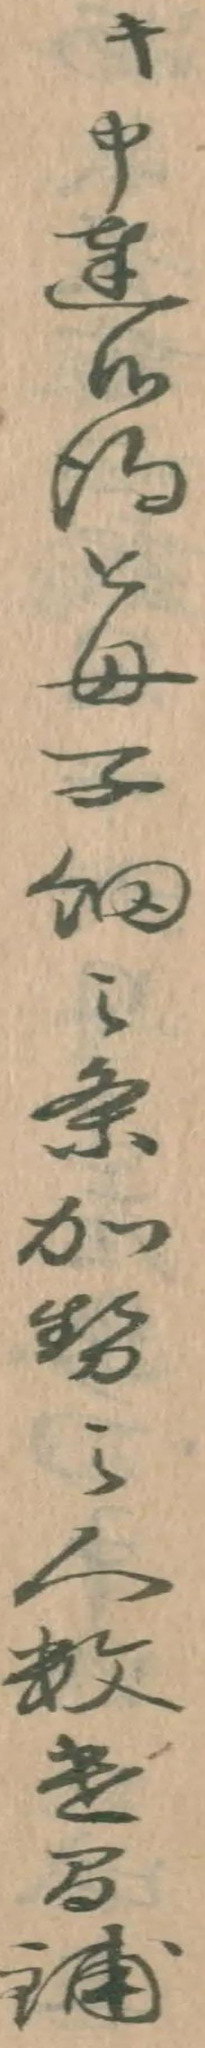キ申達候得とも子細之条加勢之人数遣間鋪
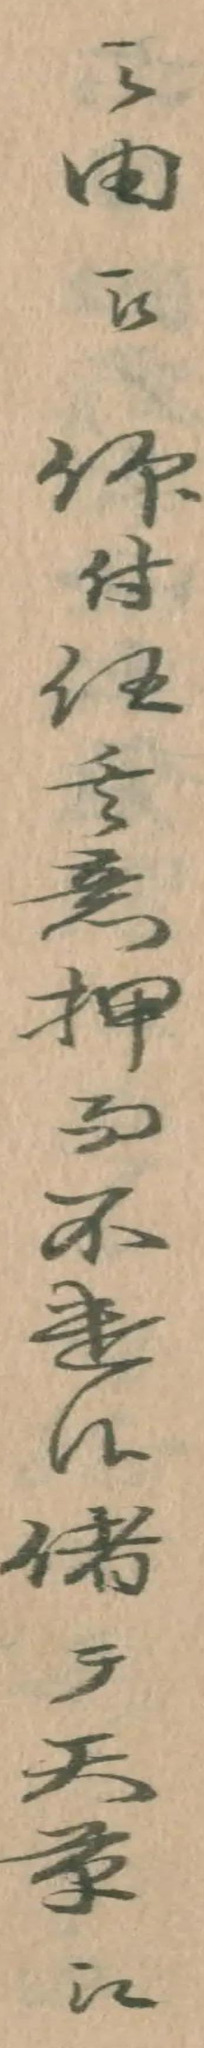之由被仰付任其意押而不遣候偖テ天草江
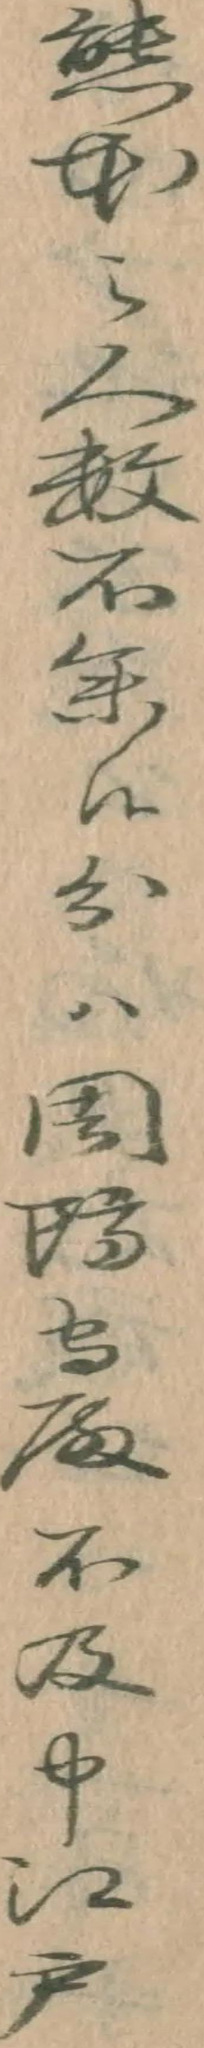熊本之人数不参候分は周防守殿不及申江戸
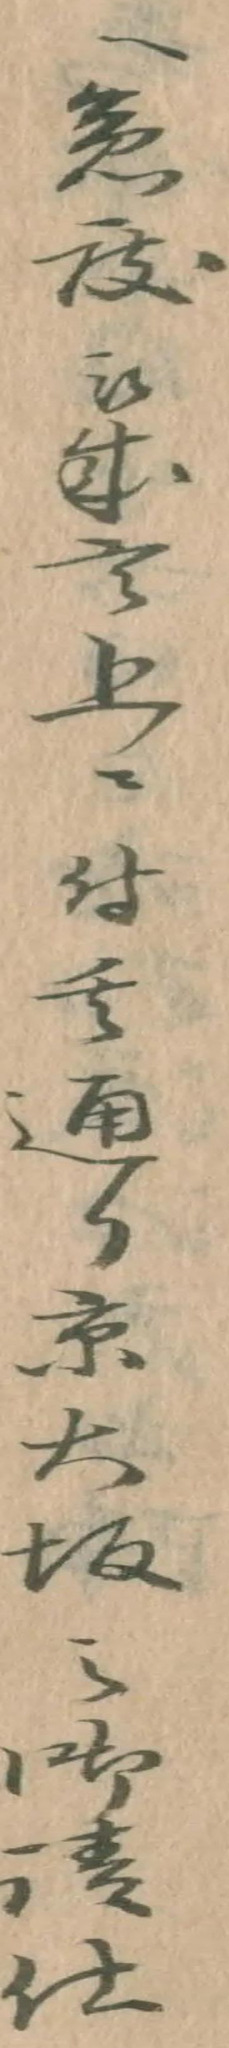へ急度被成言上に付其通り京大坂之御請仕
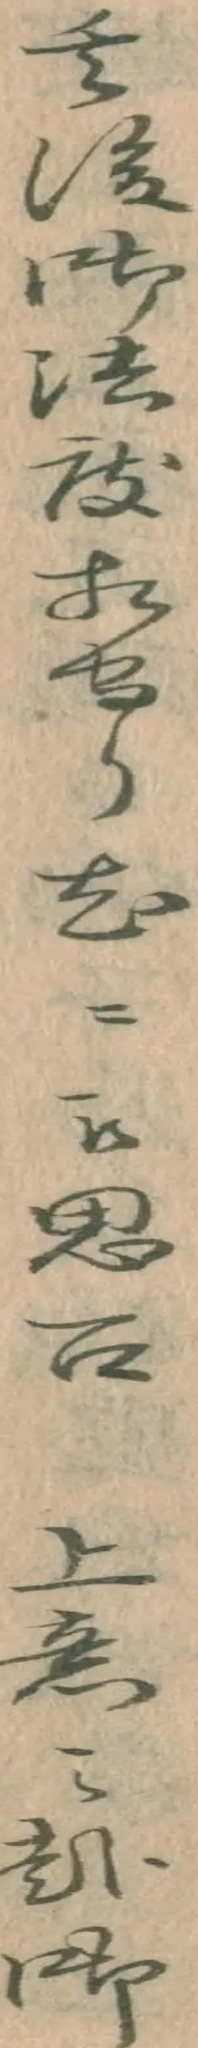其後御法度相守り尤に被思召上意之赴御
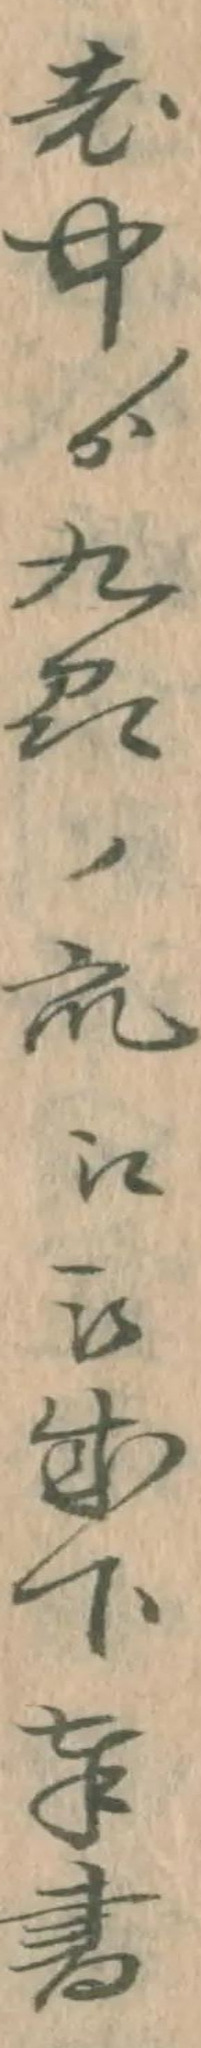老中ゟ九州ノ衆江被成下奉書
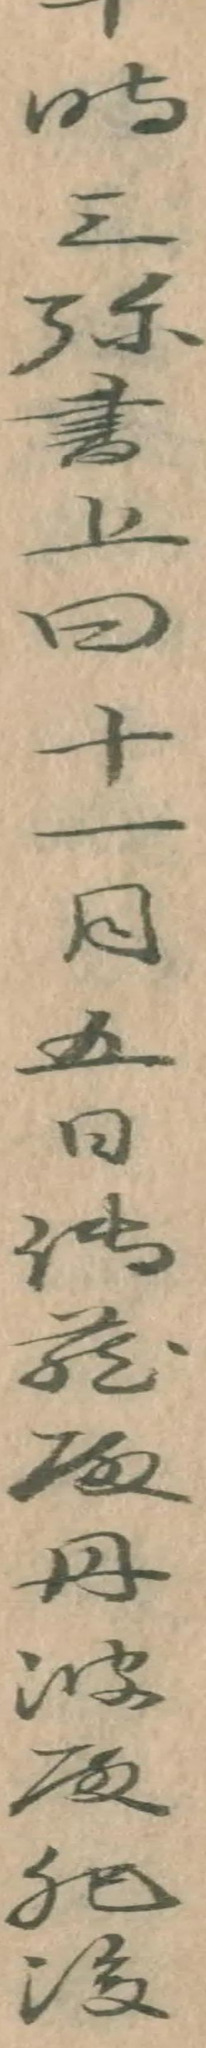十時三弥書上曰十一月五日伝蔵殿丹波殿肥後
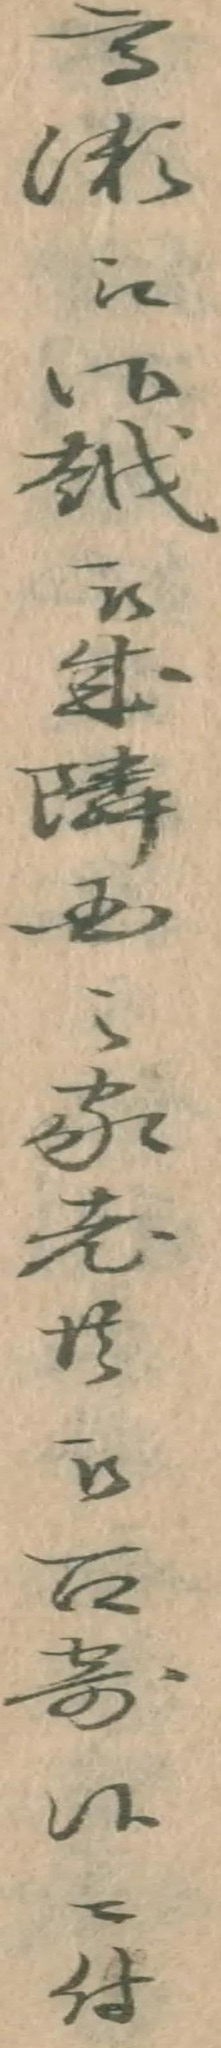高瀬江御越被成隣国之家老共被召寄候に付
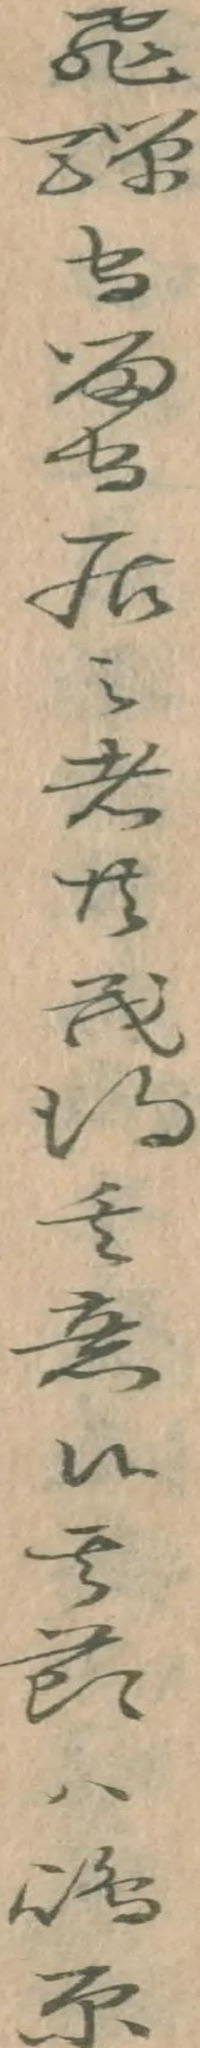飛騨守留守居之者共も得其意候其節は島原
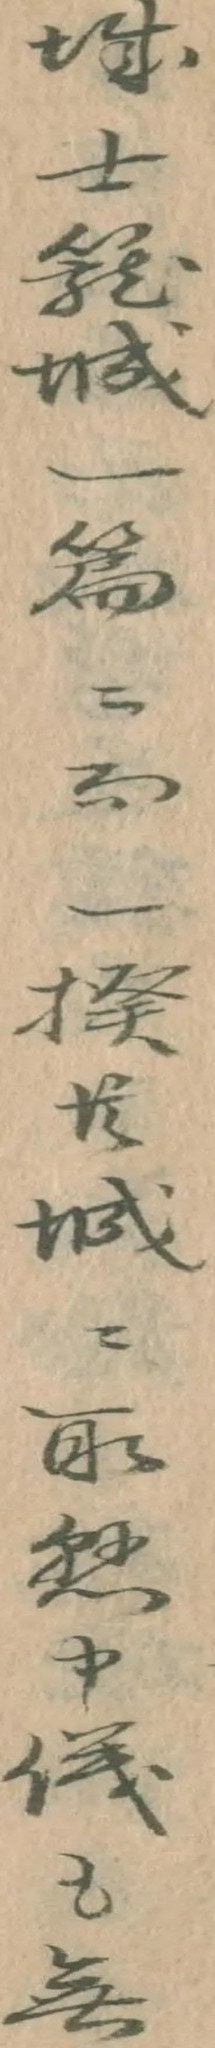城士籠城一篇に而一揆共城に取懸申儀も無

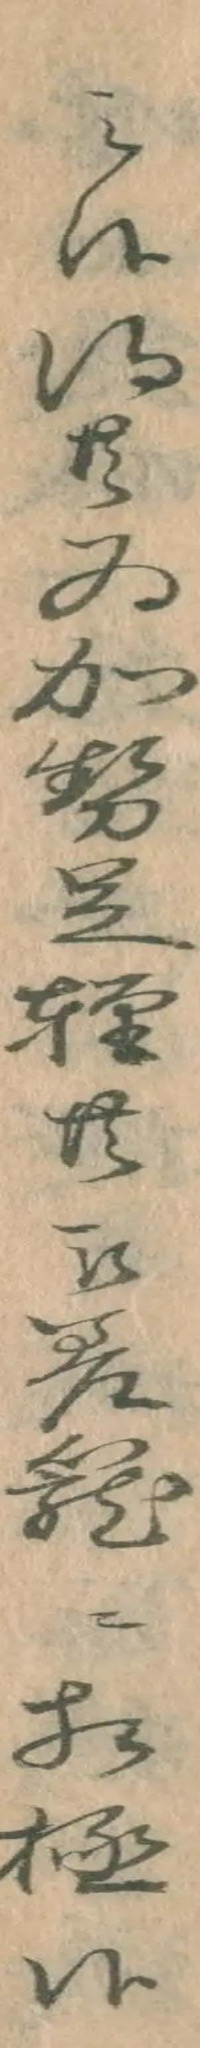之候得共為加勢足軽共被差籠に相極候
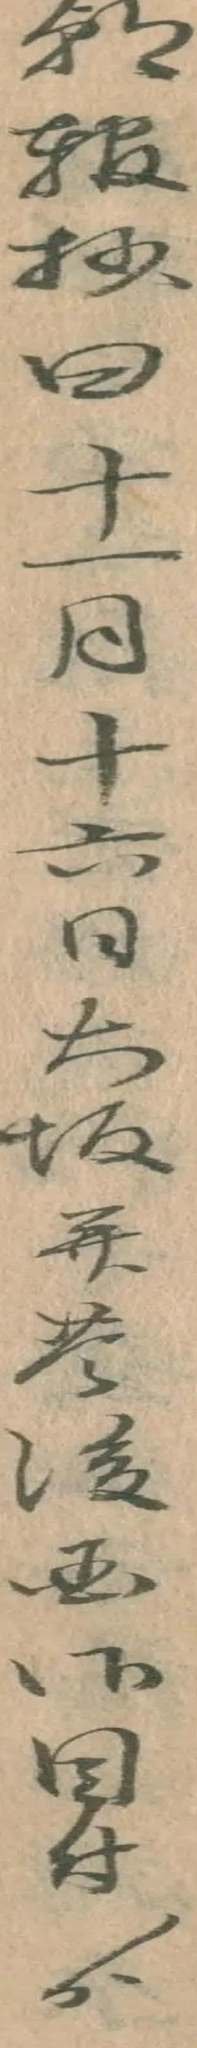朝報抄曰十一月十六日大坂并豊後国御目付ゟ
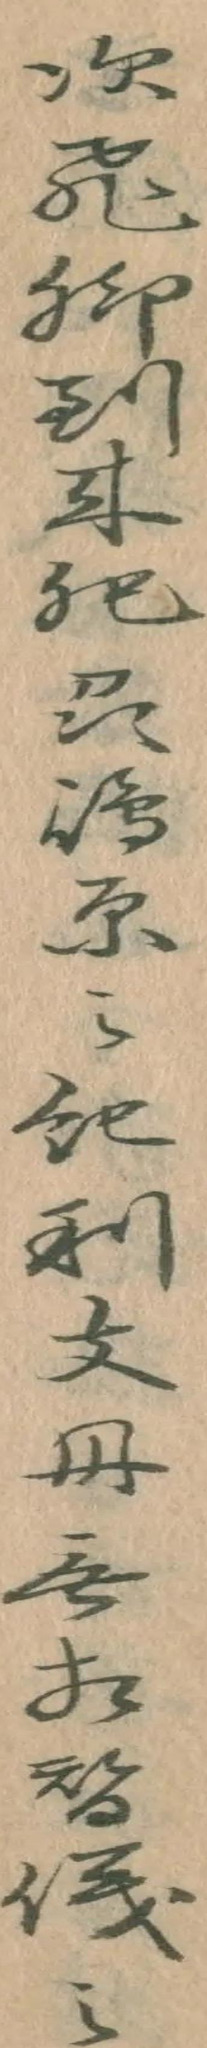次飛脚到来肥州島原之紀利支丹無相替儀之
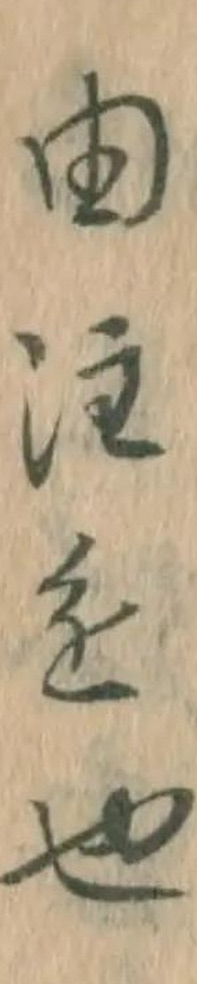由注進也
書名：切支丹御退治記 49巻. [3]
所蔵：国立国会図書館 National Diet Library, JAPAN
